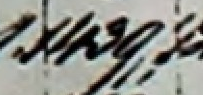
1439/f
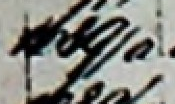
1689/a
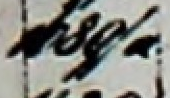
1689/a
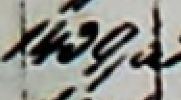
1439/a
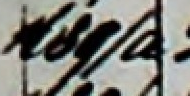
1689/a
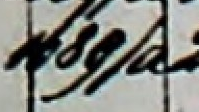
1689/a
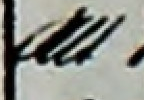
Alt
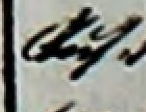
Aus„
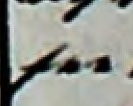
see
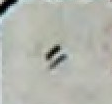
„
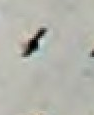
„
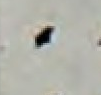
„
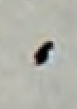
„
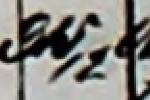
315,2
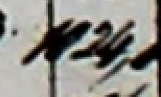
1124,0
